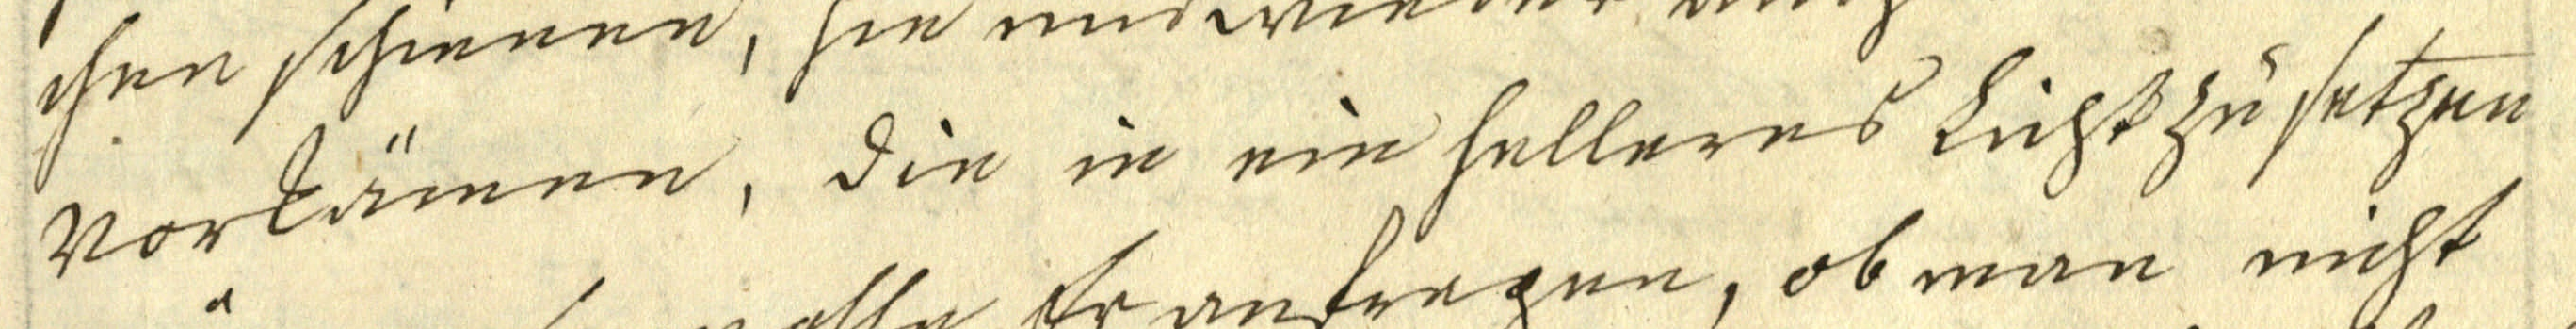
vorkämen, die in ein helleres Licht zu setzen
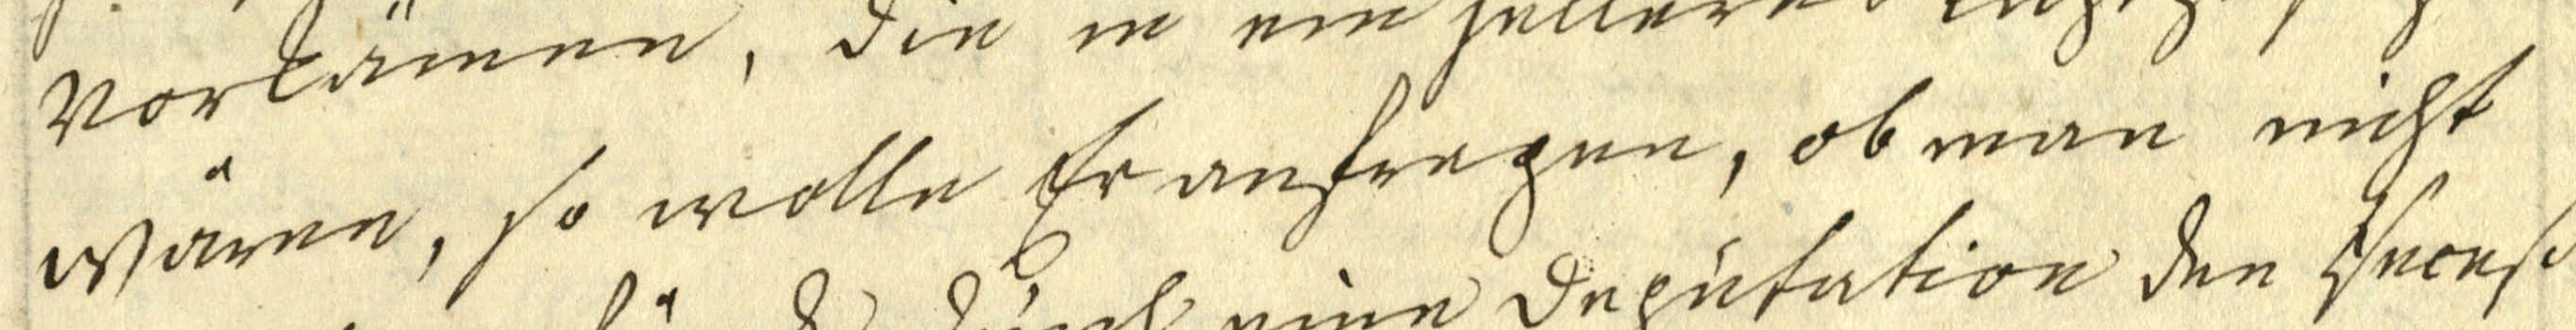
wären, so wolle Er anfragen, ob man nicht
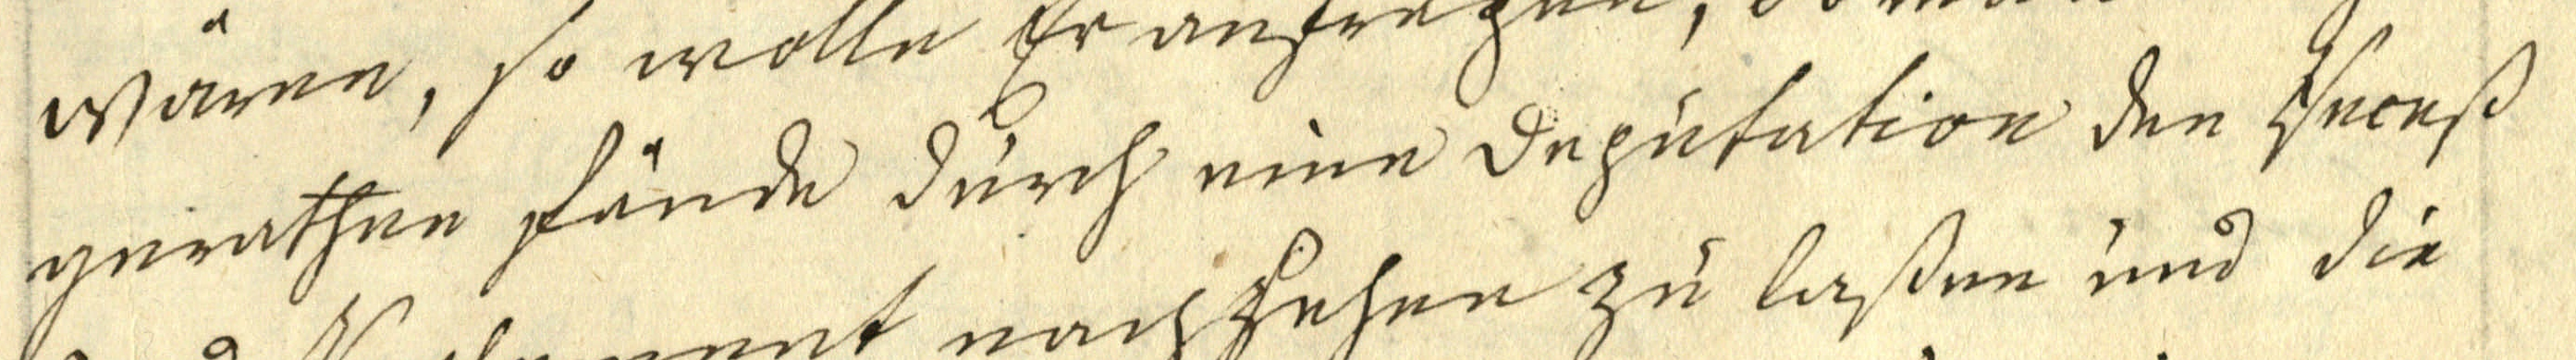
gerathen fände durch eine Deputation den Receß
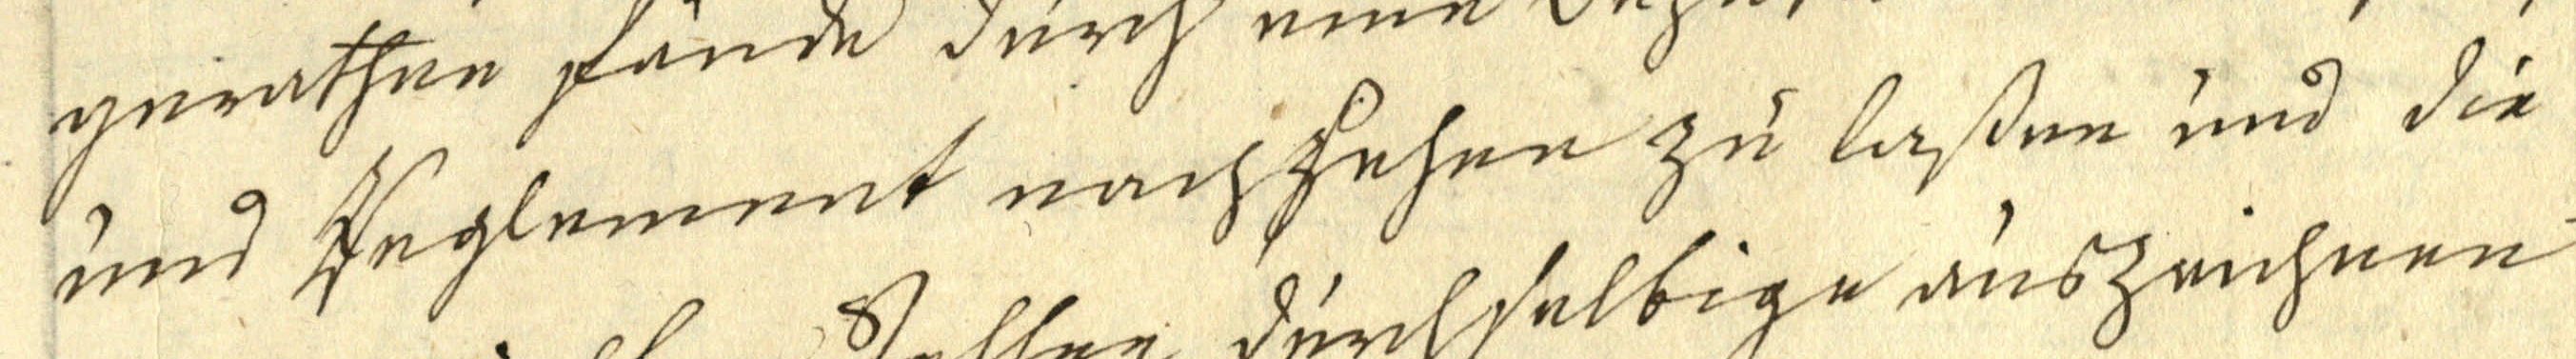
und Reglement nachsehen zu laßen und die
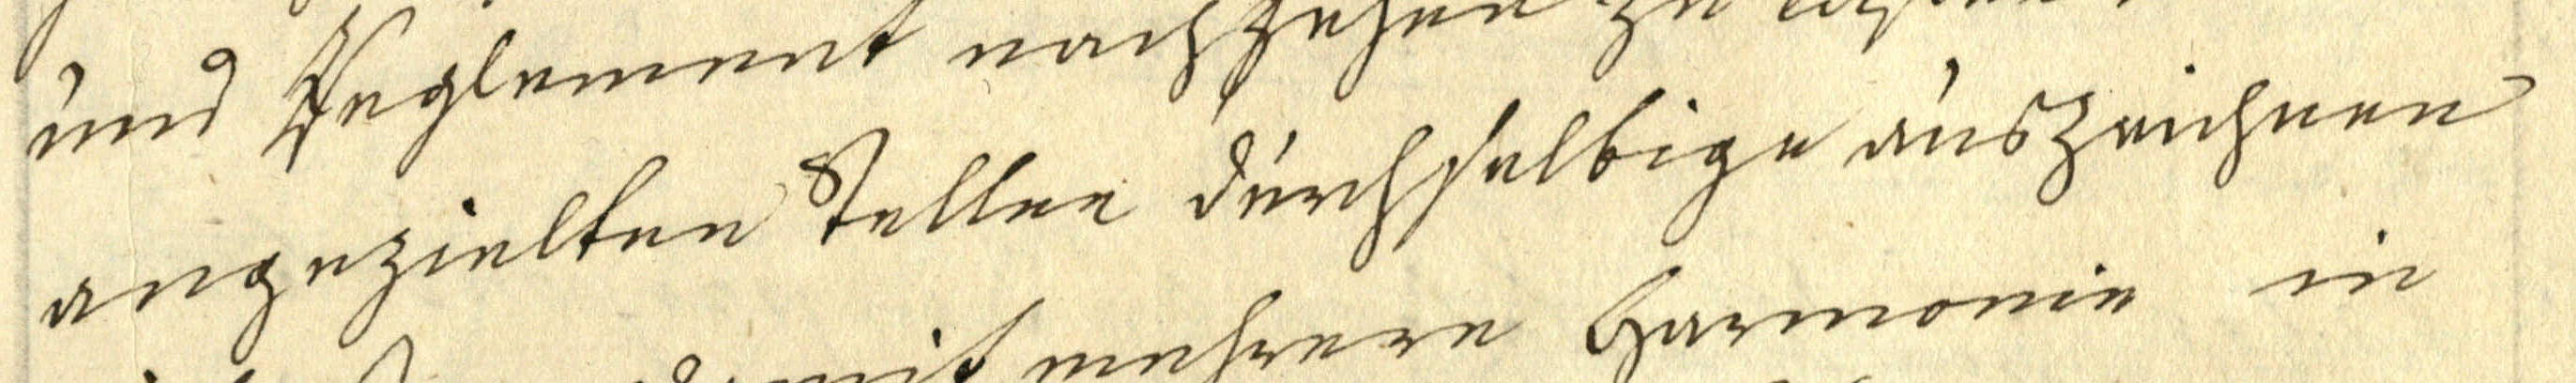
angezielten Stellen durch selbige auszeichnen
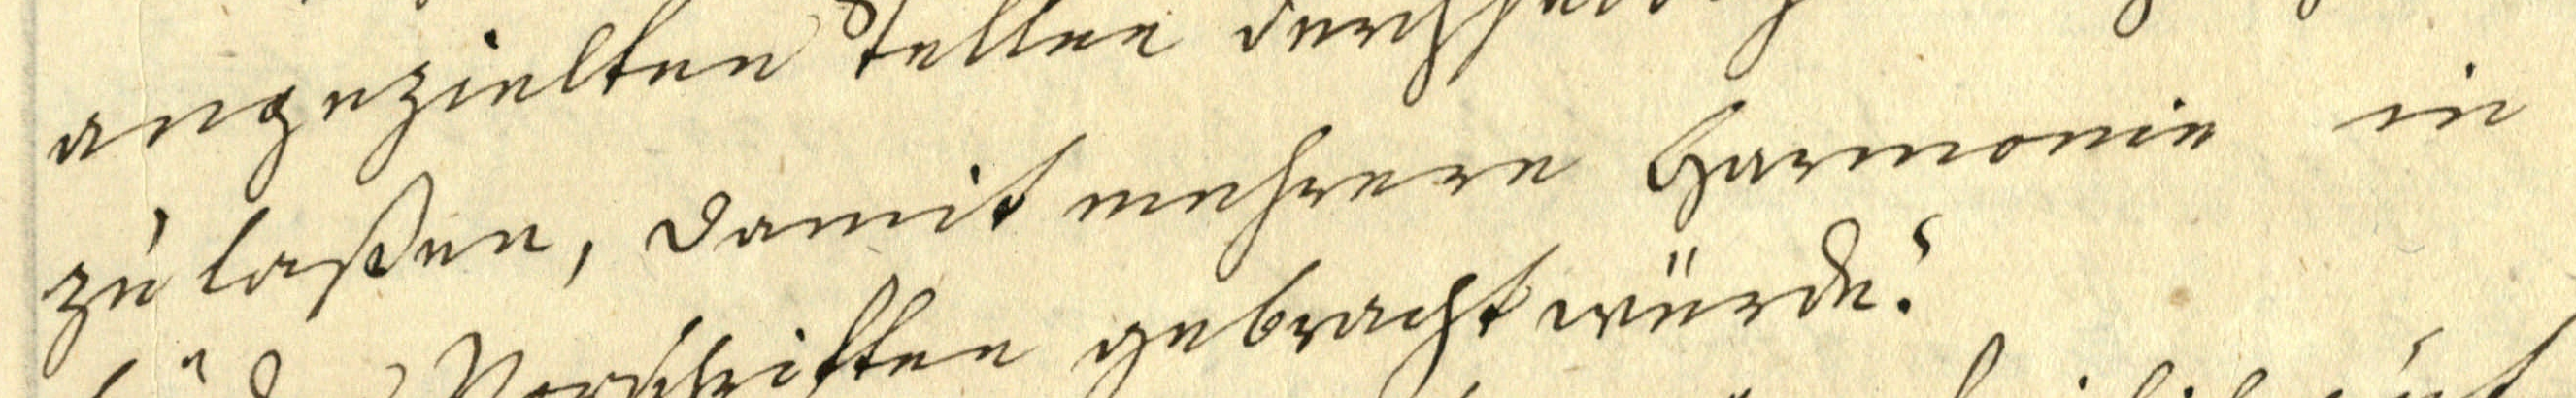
zu lassen, damit mehrere Harmonie in
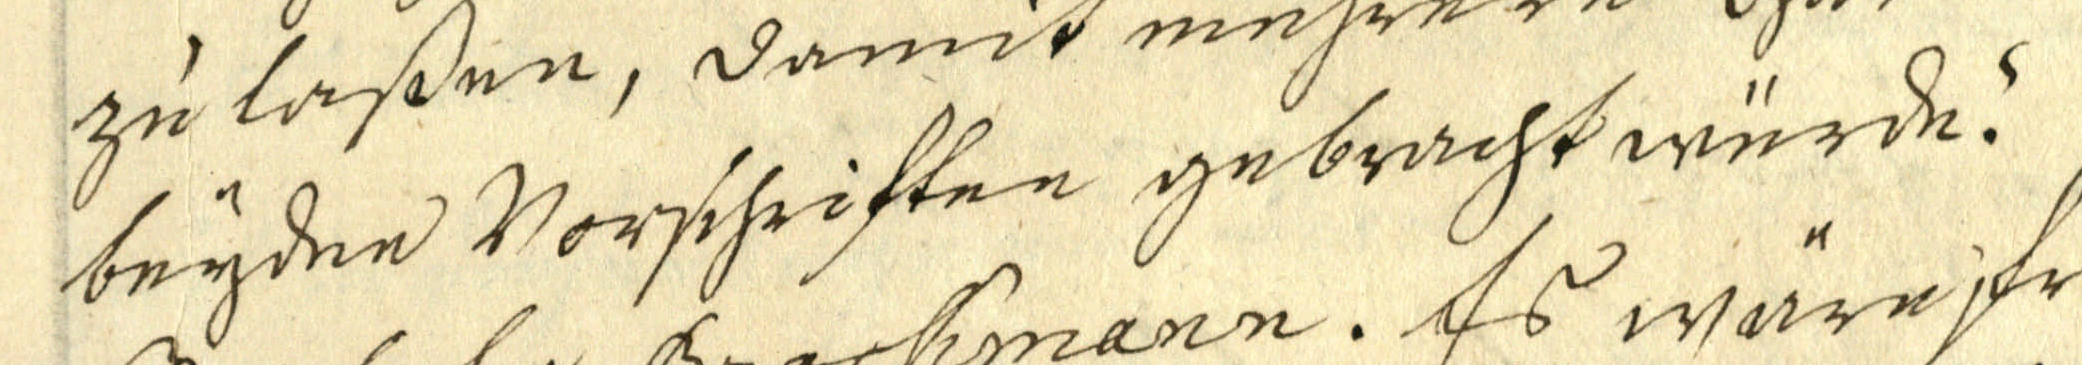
beÿden Vorschriften gebracht würde?
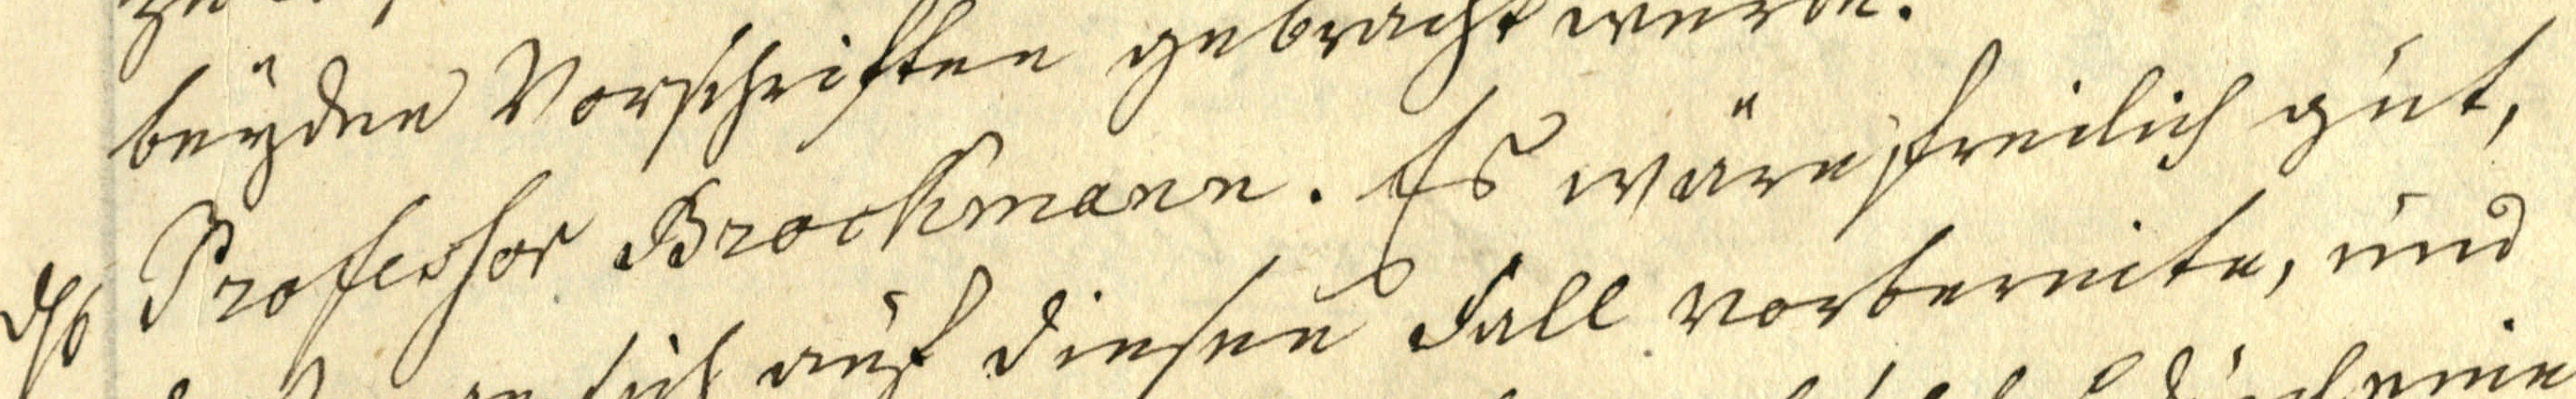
dh Professor Brockmann. Es wäre freilich gut,
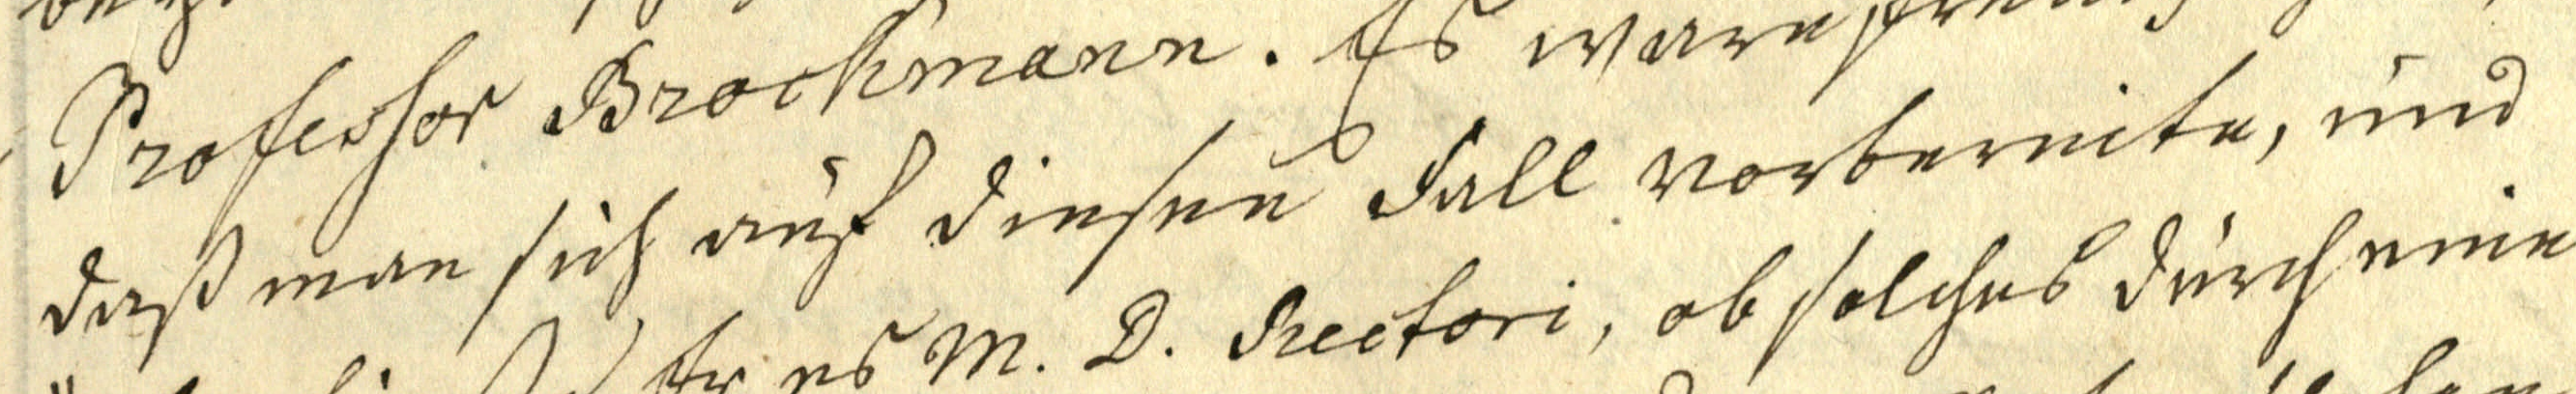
daß man sich auf diesen Fall vorbereite, und
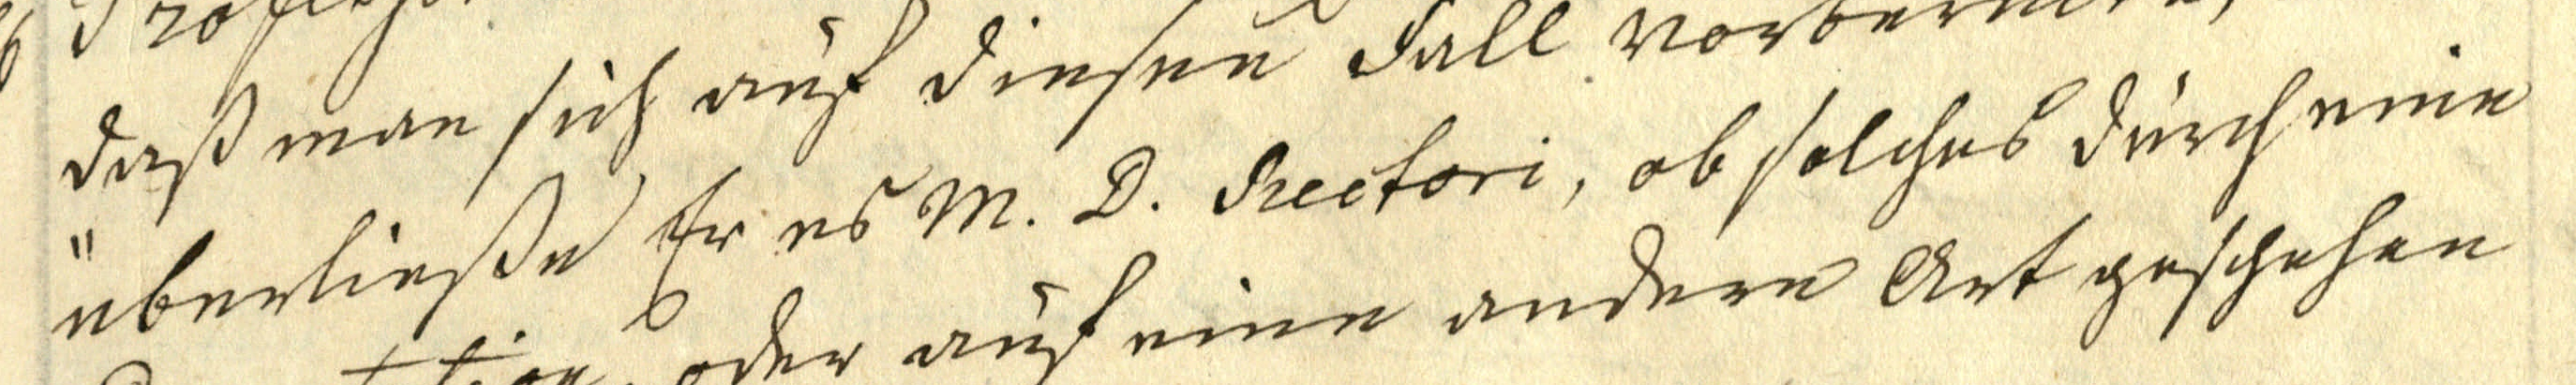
überließe Er es M. D. Rectori, ob solches durch eine
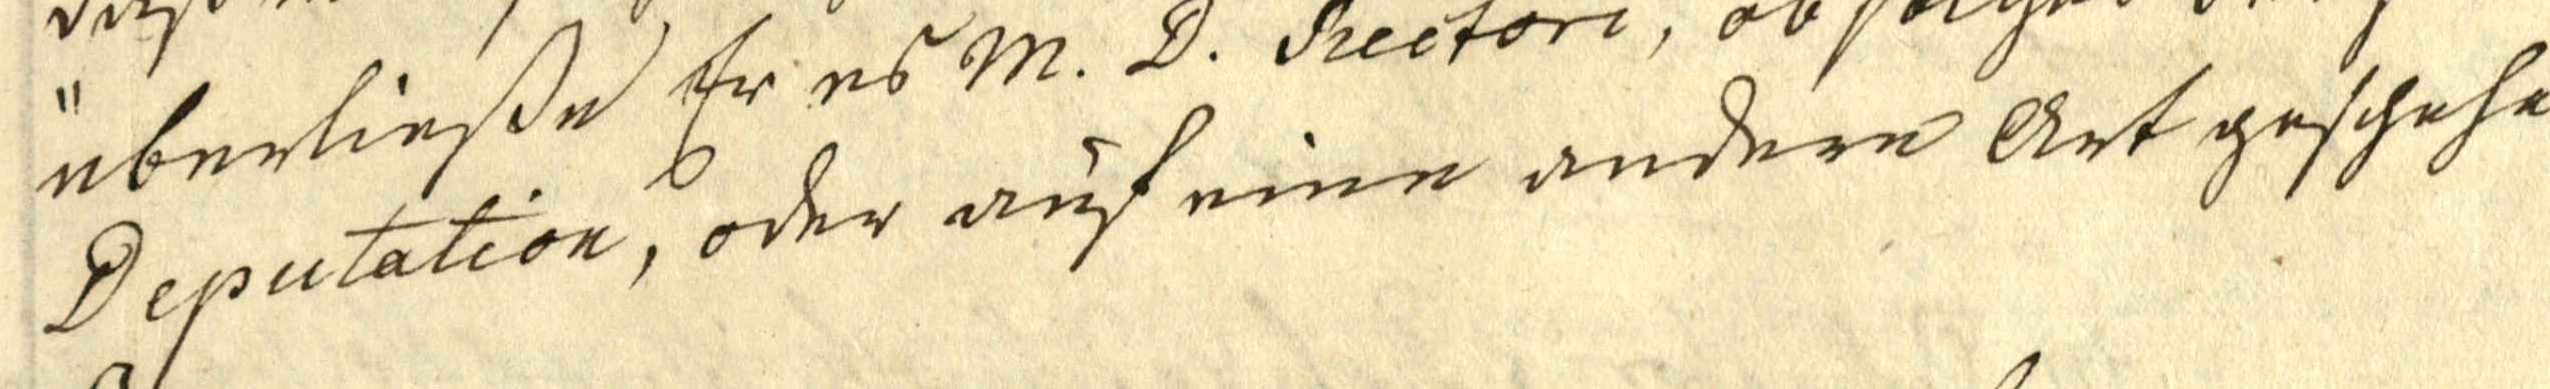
Deputation, oder auf eine andere Art geschehen
